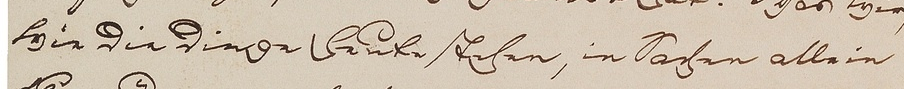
wie die Dinge heute stehen, in Sachen allein
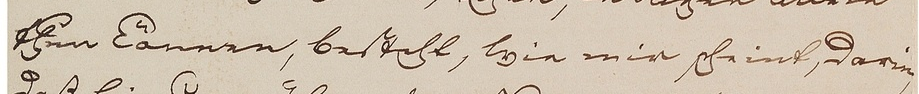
thun können, besteht, wie mir scheint, darin,
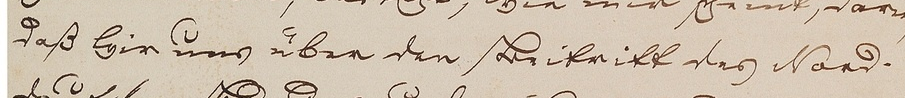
daß wir uns über den Beitritt des Nord-
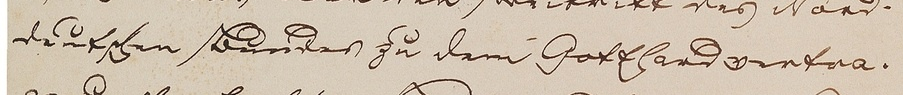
deutschen Bundes zu dem Gotthardvertra-
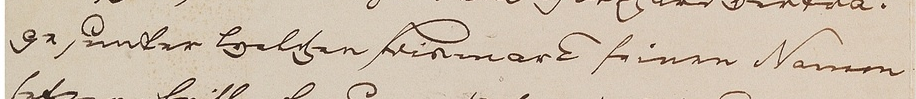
ge, unter welchen Bismark seinen Namen
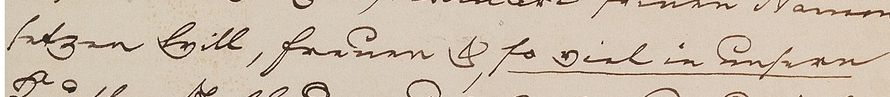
setzen will, freuen &, so viel in unsern
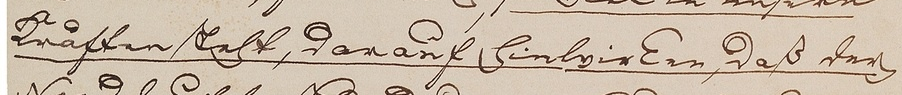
Kräften steht, darauf hinwirken, daß der
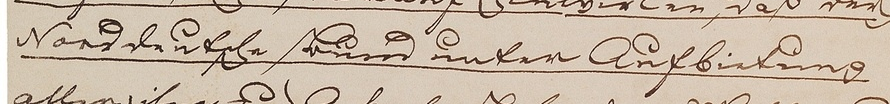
Norddeutsche Bund unter Aufbietung
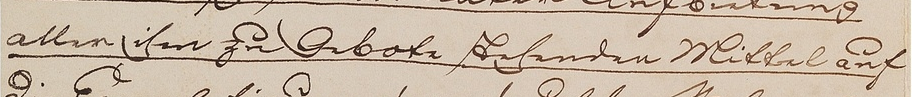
aller ihm zu Gebote stehenden Mittel auf
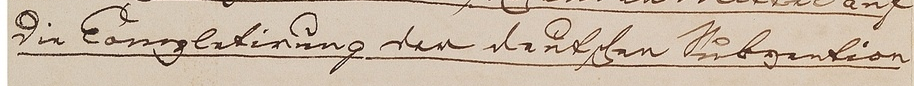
die Completirung der deutschen Subvention
